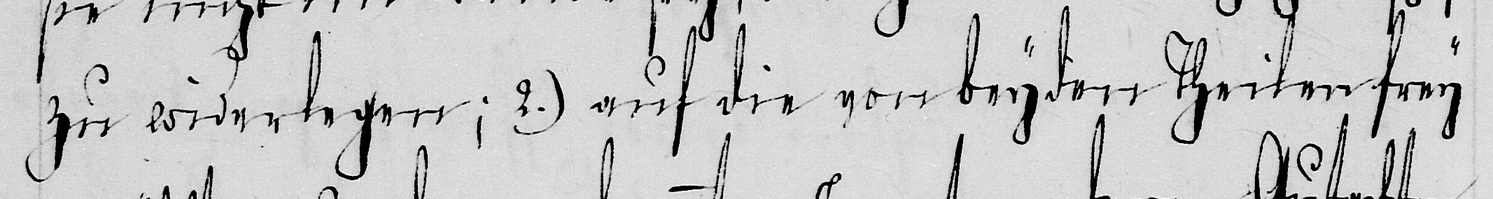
zu widerlegen; 2.) auf die von beyden Theilen frey
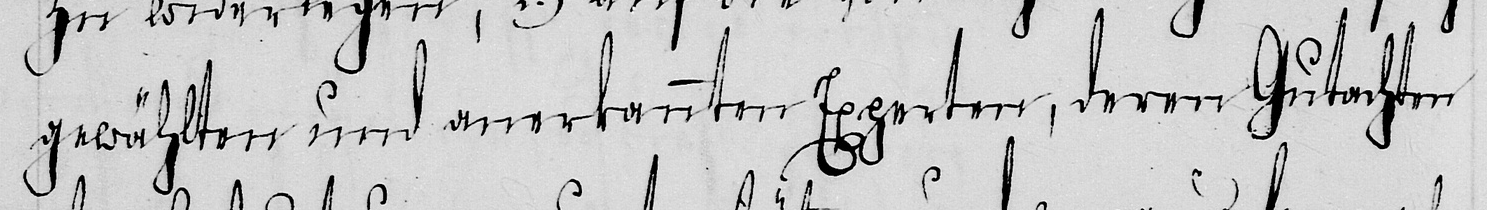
gewählten und anerkannten Experten, deren Gutachten
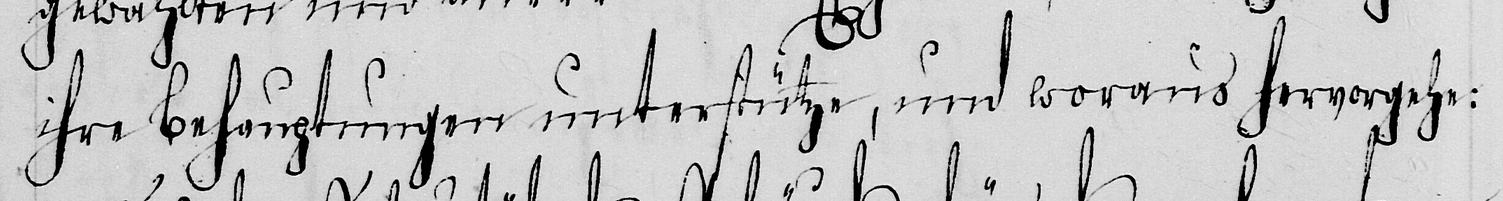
ihre Behauptungen unterstütze, und woraus hervorgehe:
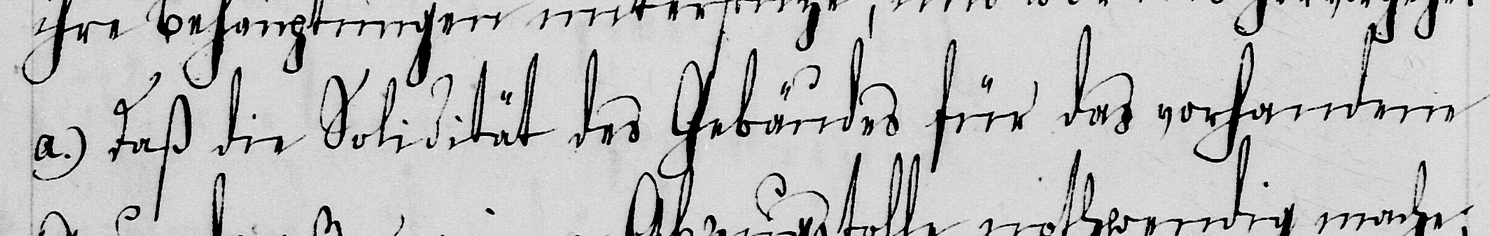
a.) Daß die Solidität des Gebäudes für das vorhandene
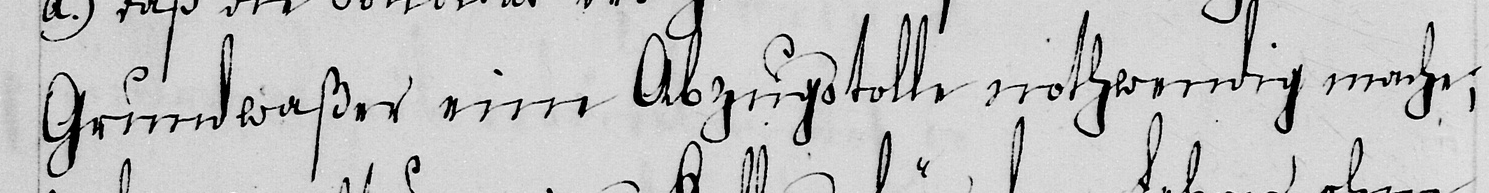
Grundwaßer eine Abzugstolle nothwendig mache;
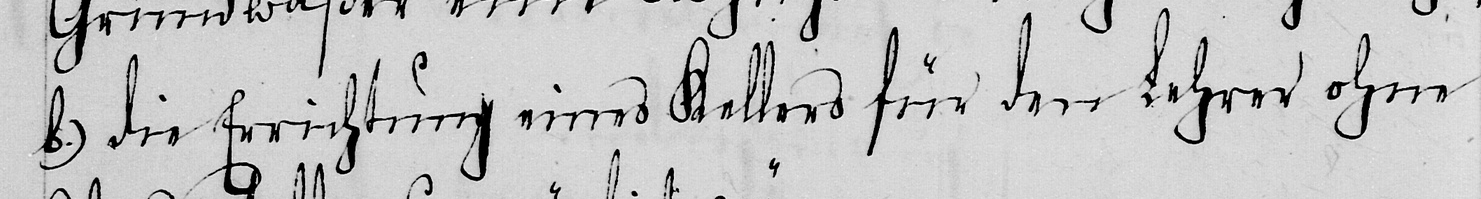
b.) die Errichtung eines Kellers für den Lehrer ohne
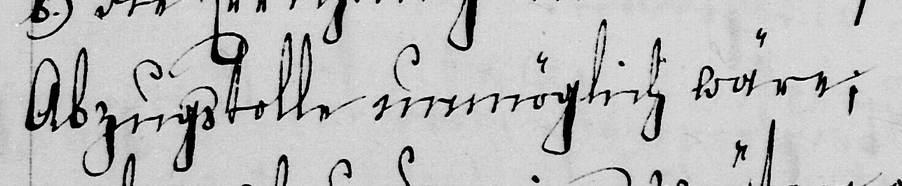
Abzugstolle unmöglich wäre;
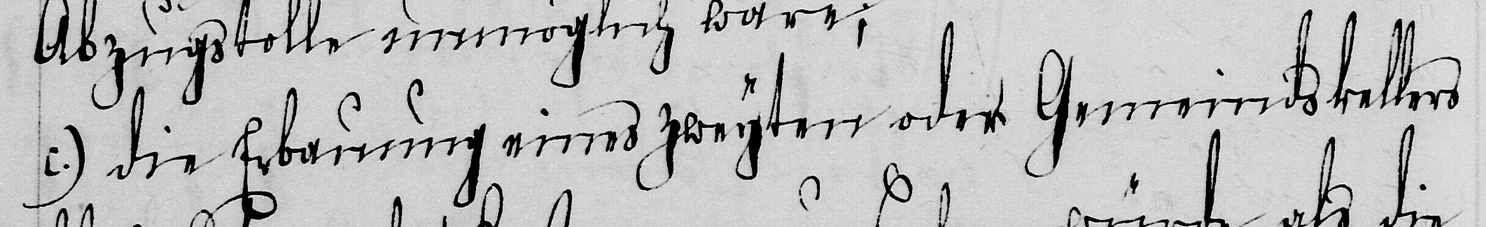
c.) die Erbauung eines zweyten oder Gemeindskellers
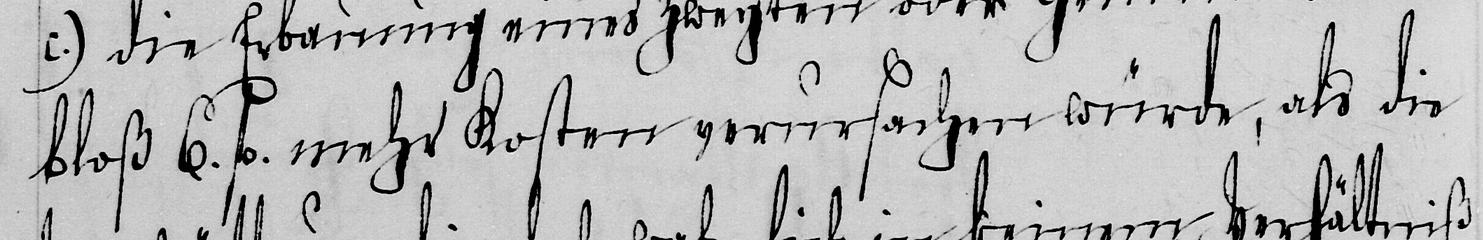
bloß 6. fl. mehr Kosten verursachen würde, als die
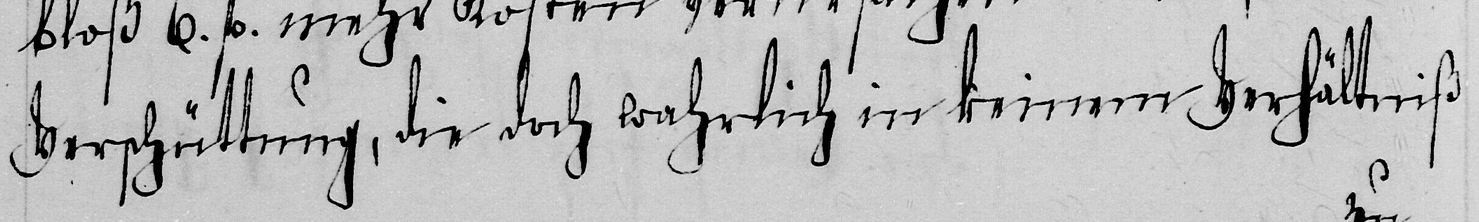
Verschüttung, die doch wahrlich in keinem Verhältniß
